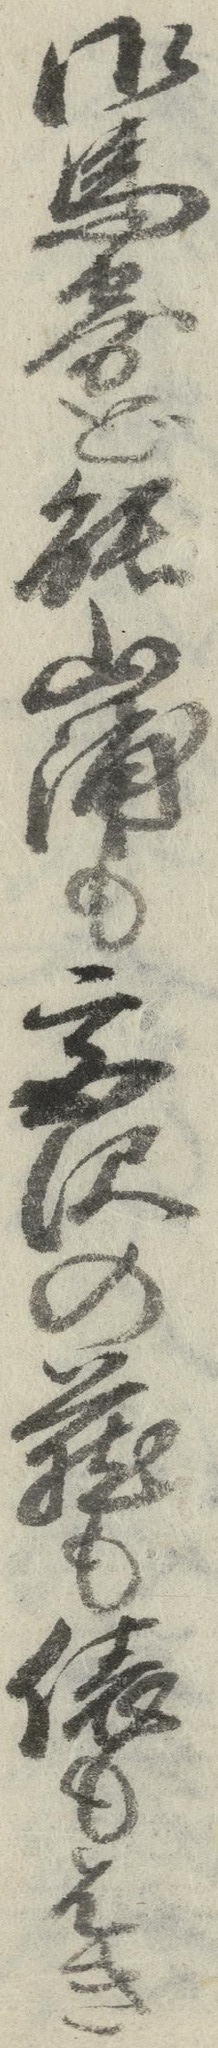御馬寄ど能山浦も宮沢の蔵も俵もはき
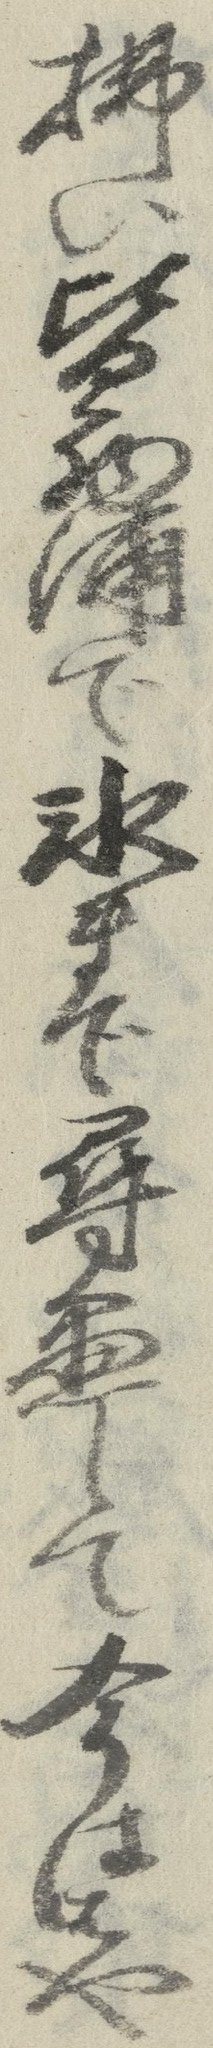払い皆西浦で氷まで尋画して今ははや
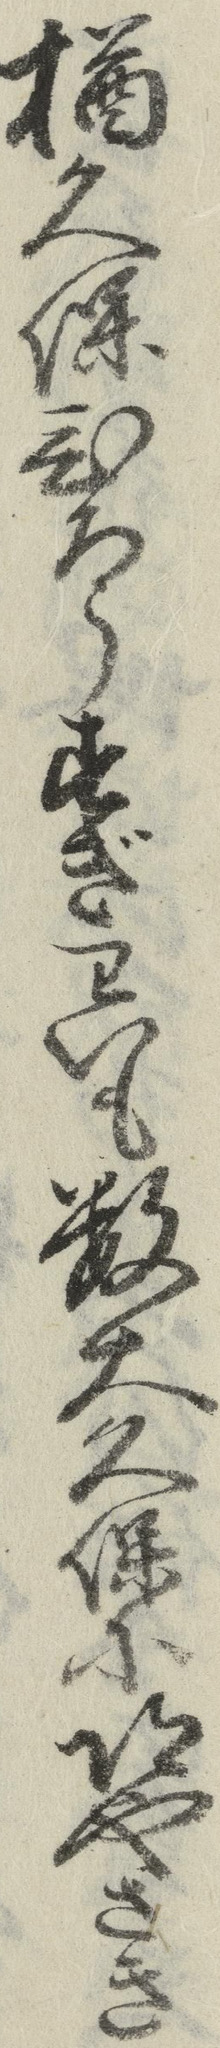楢久保ひろうすぎわいも数大久保に跡やさき
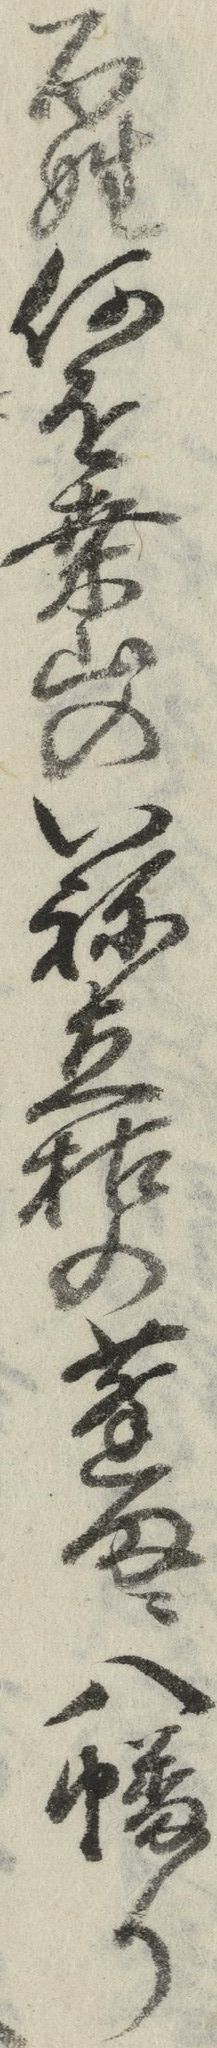百姓何を葉山のいね立枯の蓬田に八幡り
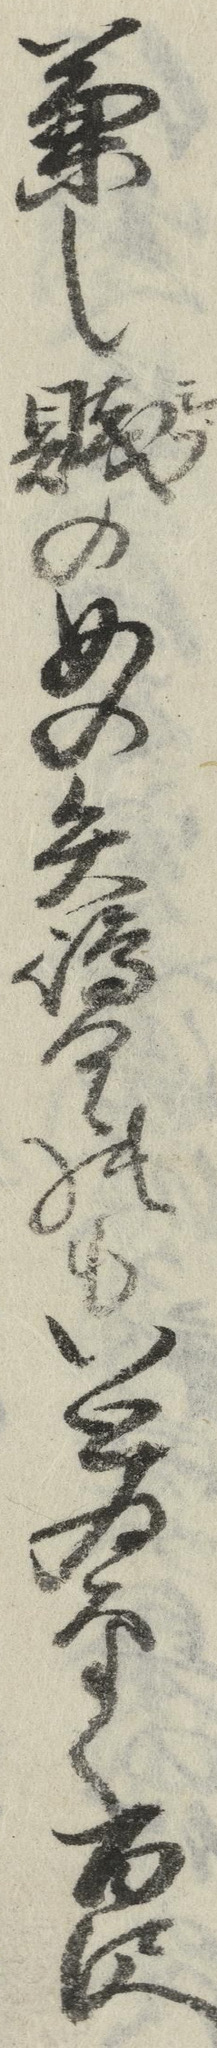兼し賎の女の矢嶋るゝのもいとゐなく百沢
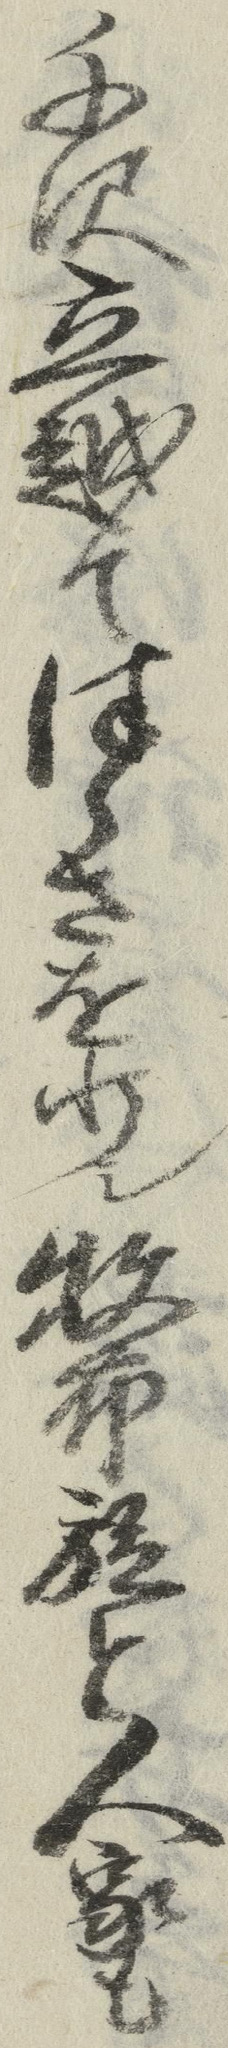千沢立越てつらさを少し牧布施と人家も
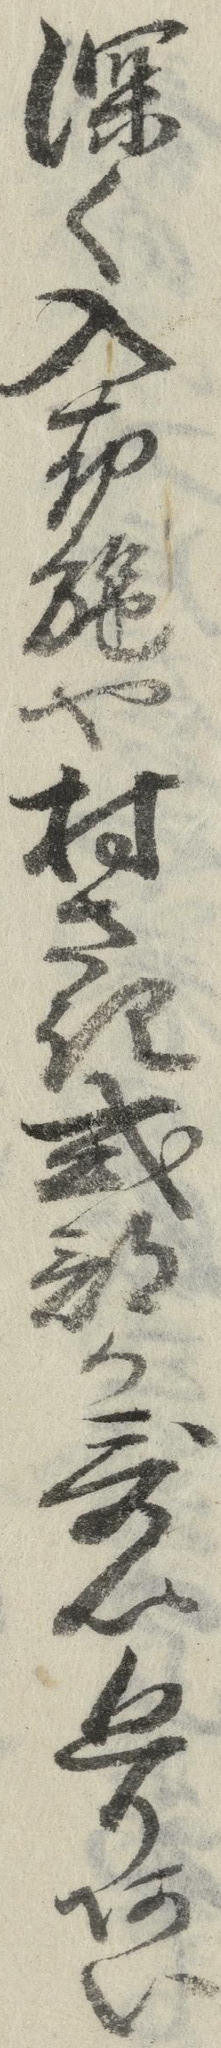深く入布施や村さき式部か哥心廻りあい
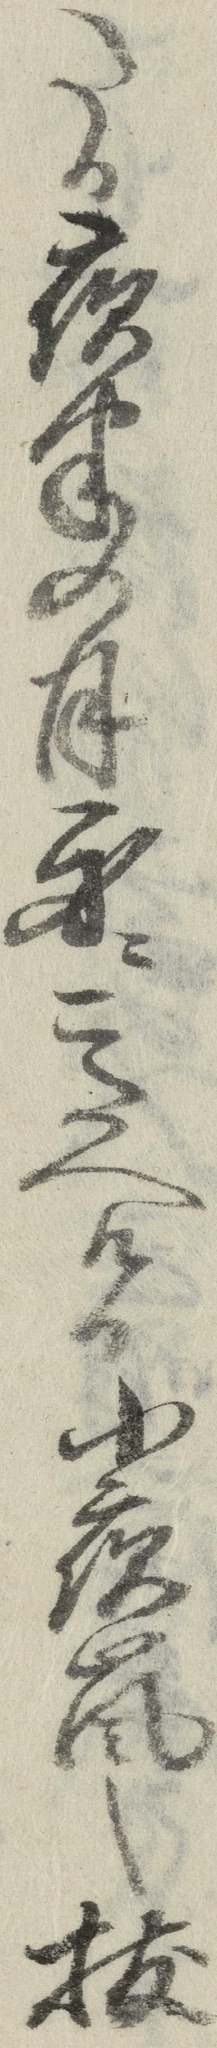たる夜半の月身にこたへける小夜嵐し抜
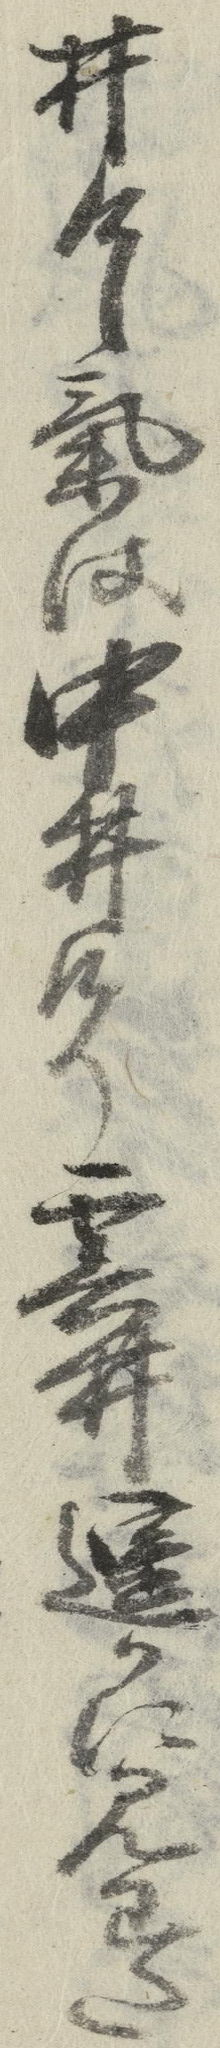井けし気は中井けり雲井遥かに見わた
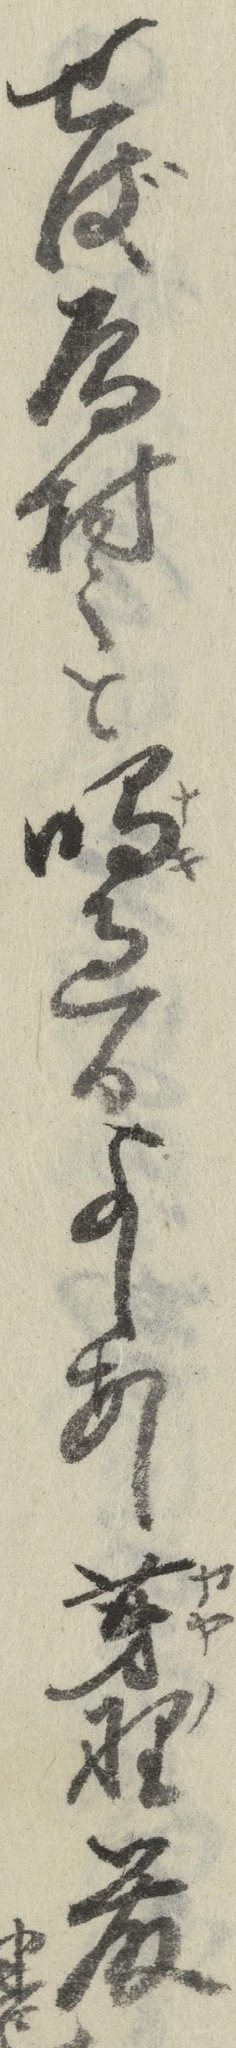せば烏村々と鳴過るよしあし茅野藤巻

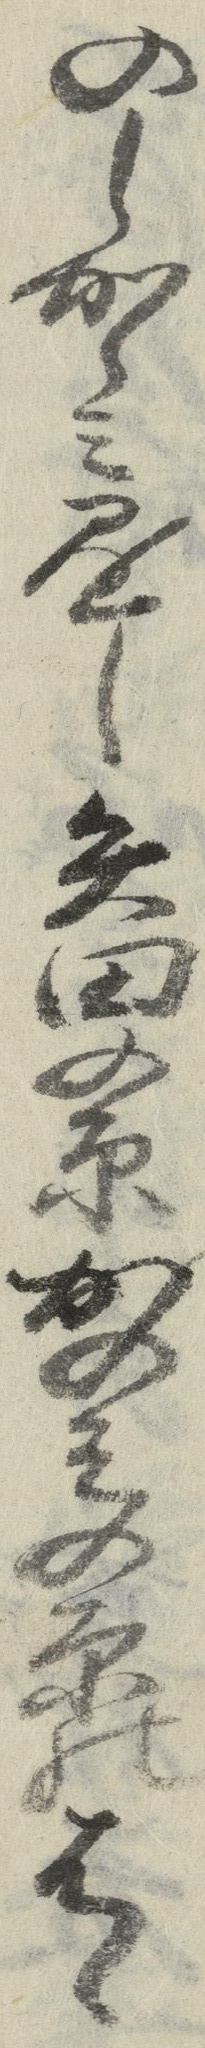のしからみ懸し矢田の原かのみの原のはゝ
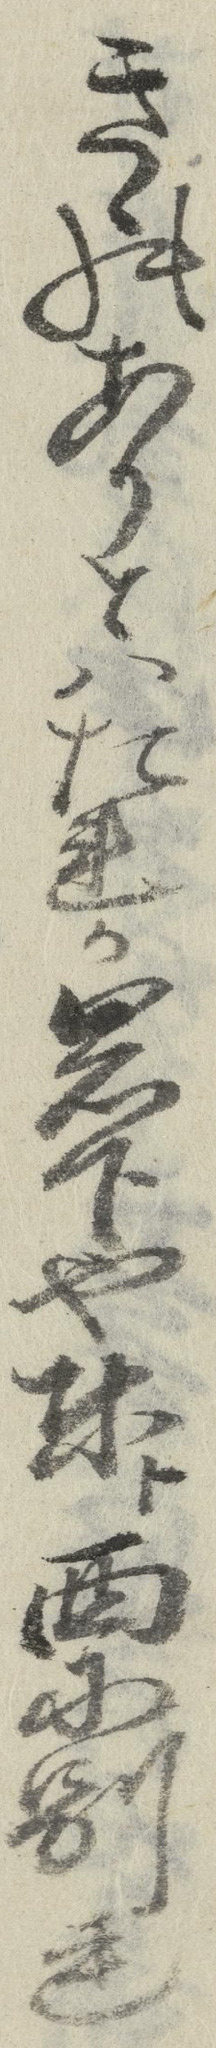きゝのありとはあたれか岩下や東西に別れ
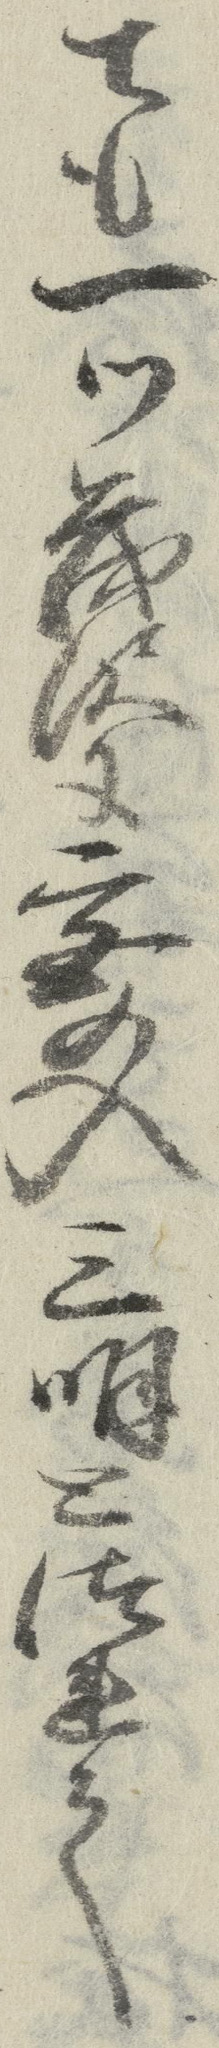ても一ツも沢に宮の入三明とつれて
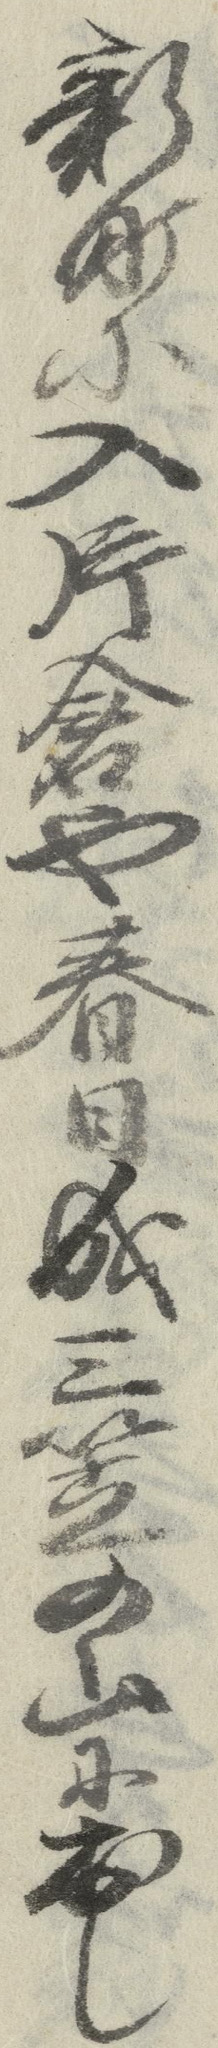新町に入片倉や春日成三笠の山に出し
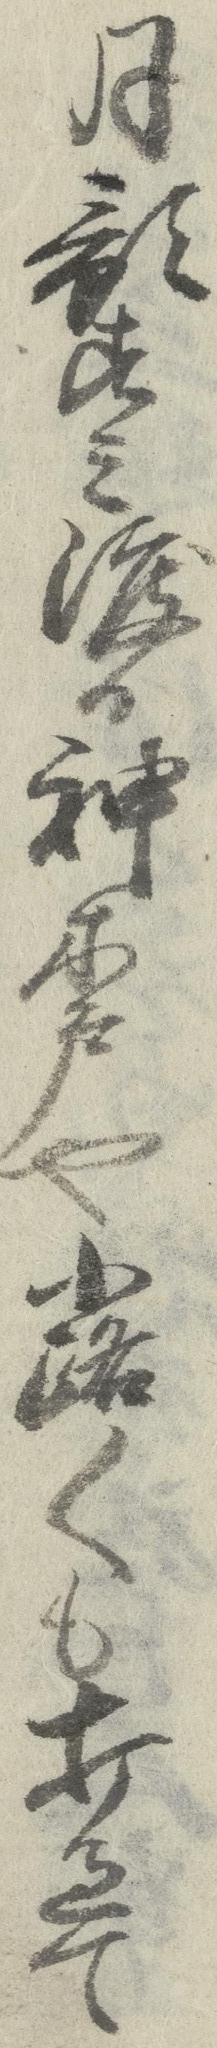月影すみ渡る神木戸や小路〳〵も打過て
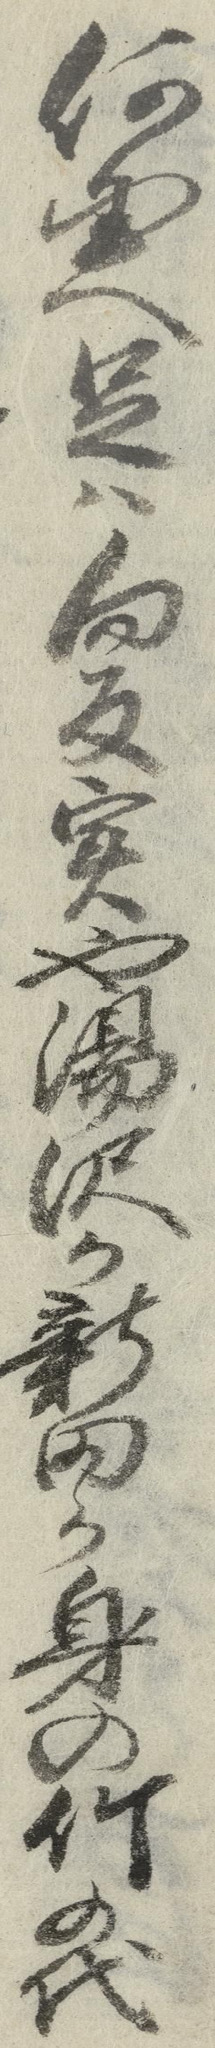何国へ足は向反実や湯沢か新田か身の竹の代
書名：浅間大焼騒動記　中
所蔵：東京大学地震研究所図書室 Earthquake Research Institute Library, The University of Tokyo, JAPAN
